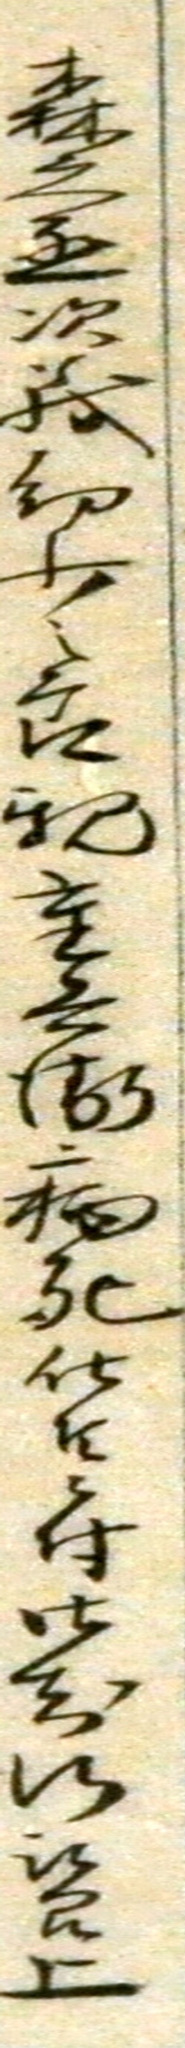森之丞次義幼少之節親重兵衛病死仕候ニ付御知行被召上
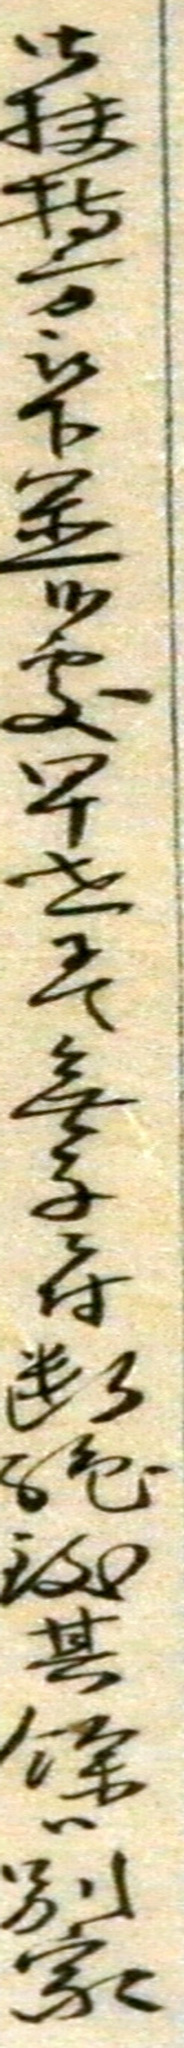御扶持方被下置候処早世にて無子ニ付断絶致其余ハ別家
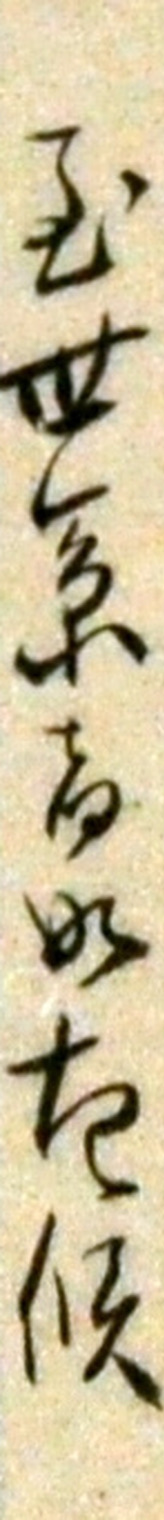至世系者如左候
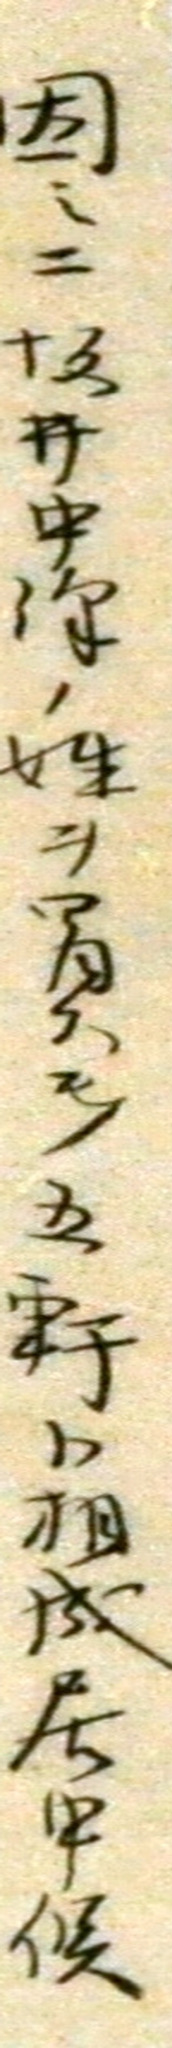因ミニ坂井中澤ノ姓ヲスモノ五軒ト相成居申候
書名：三好氏先代以来勤仕録、池田丈介一家勤仕録
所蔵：伊那市立高遠町図書館・合同会社AMANE
